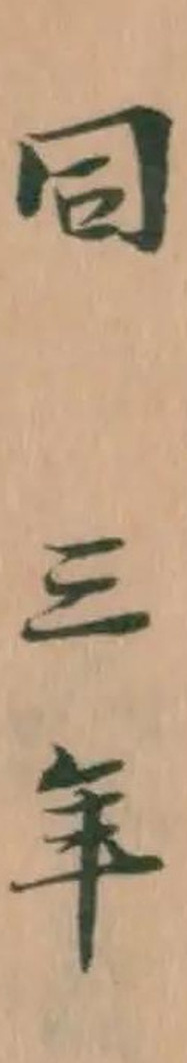同三年
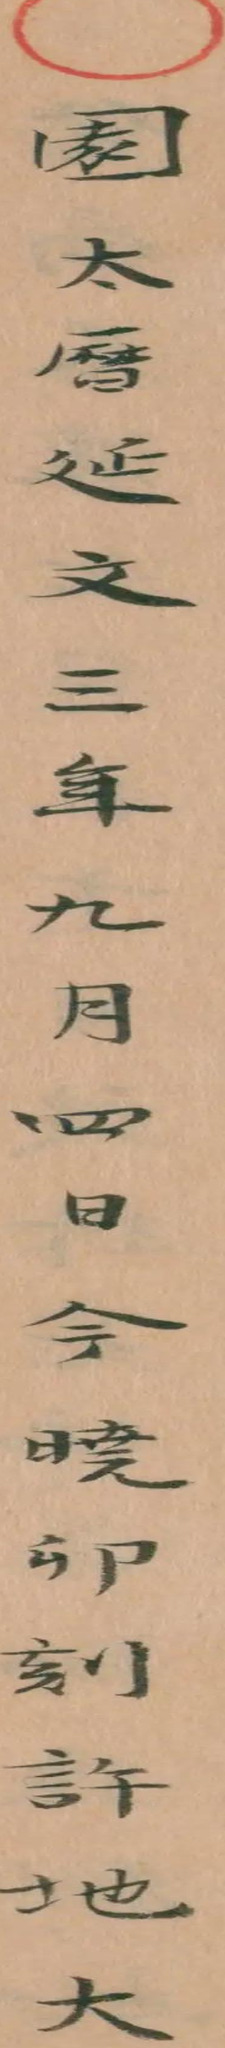○園太暦延文三年九月四日今暁卯刻許地大
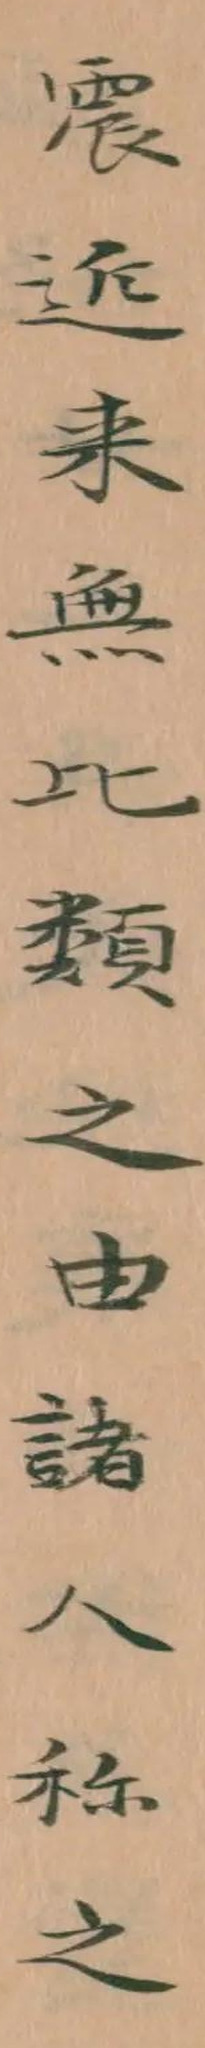震近来無比類之由諸人称之
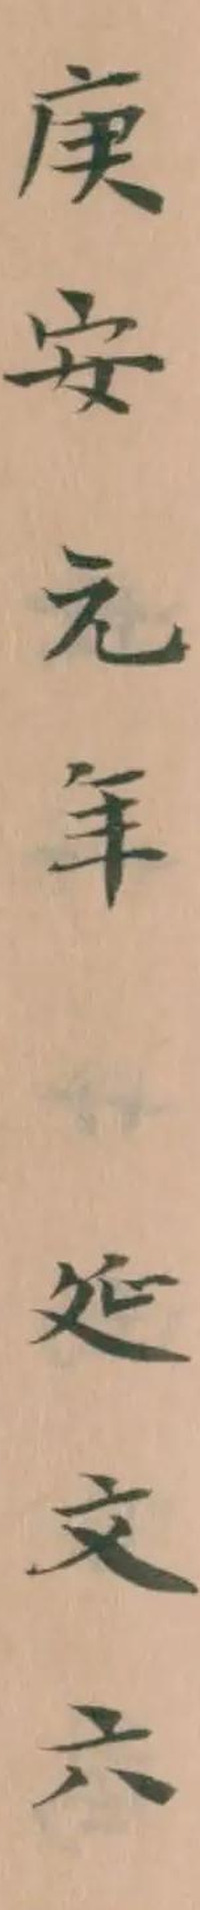庚安元年延文六
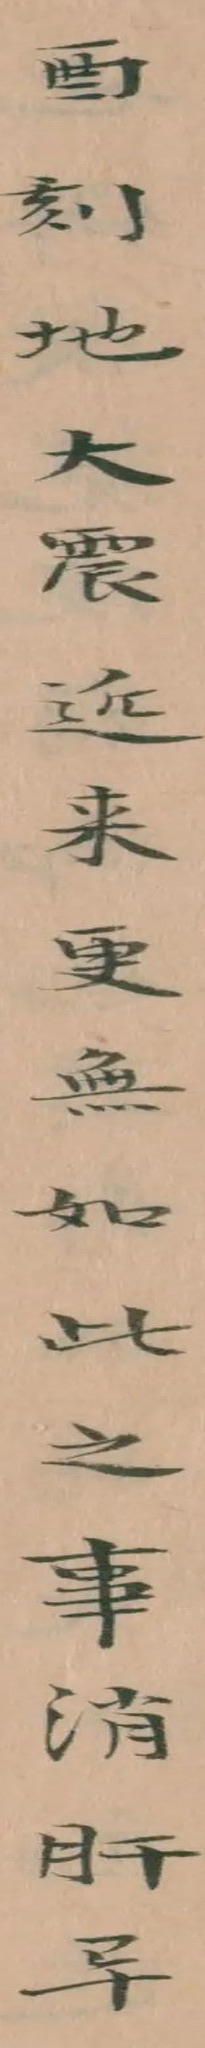酉刻地大震近来更無如此之事消肝畢
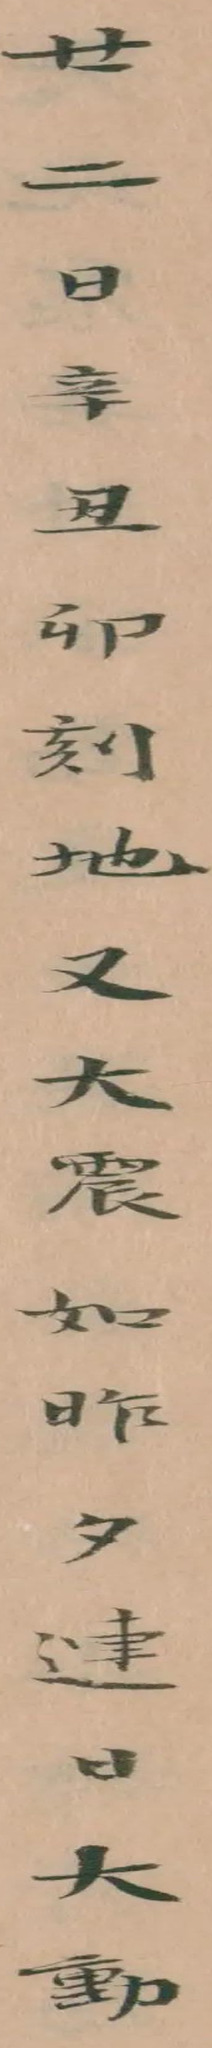廿二日辛丑卯刻地又大震如昨夕連日大動
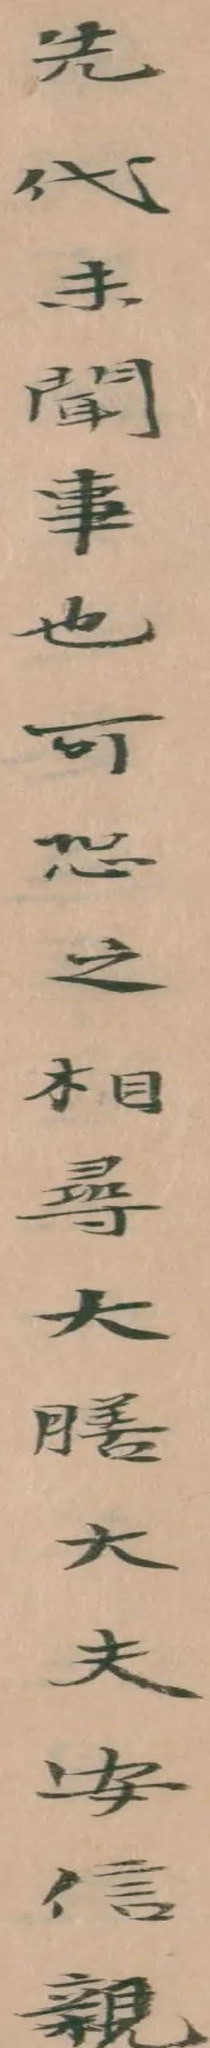先代未聞事也可恐之相尋大膳大夫安信親
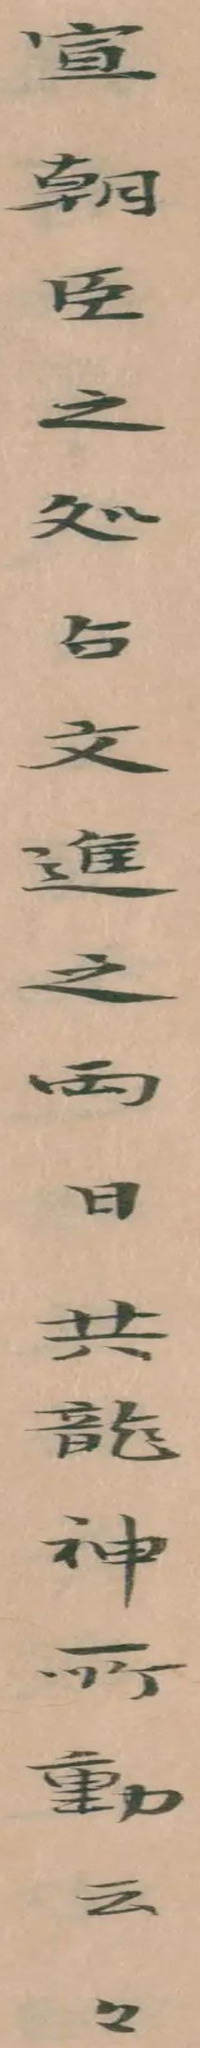宜朝臣之処占文進之両日共龍神所動云々
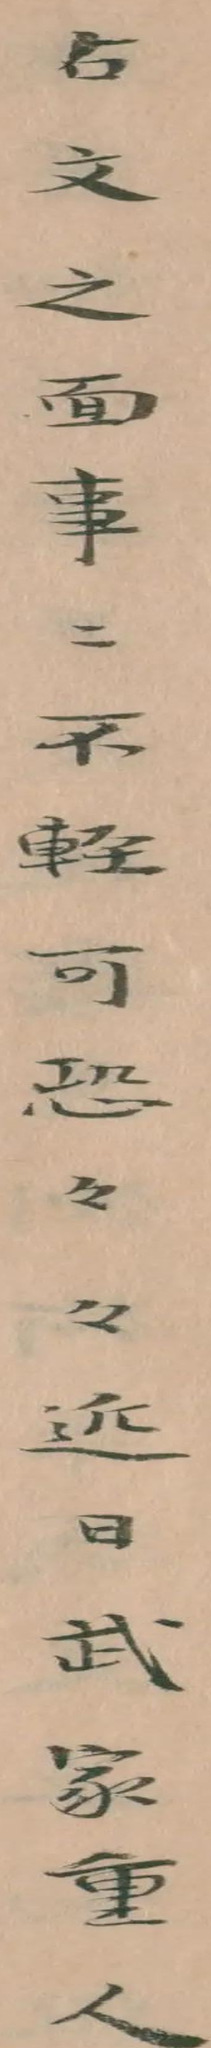占文之面事ニ不軽可恐々々近日武家重人
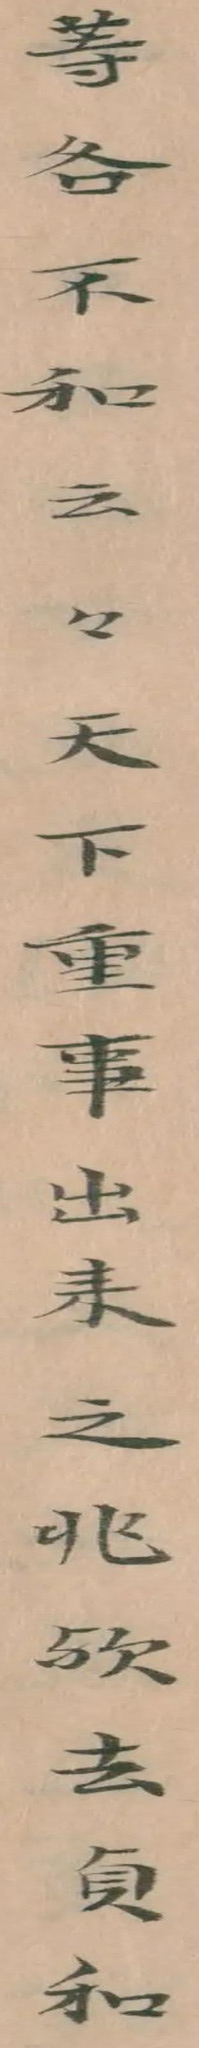等各不和云々天下重事出来之兆歟去貞和
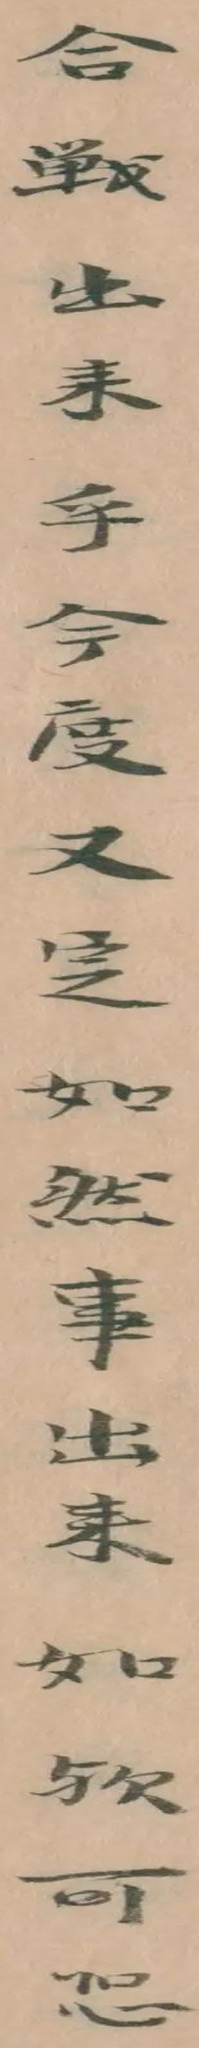合戦出来乎今度又定如然事出来如歟可恐

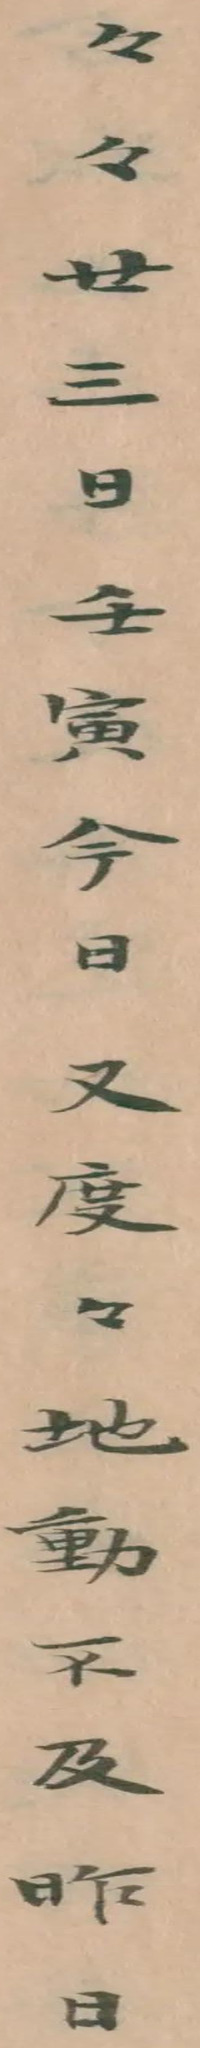々々廿三日壬寅今日又度々地動不及昨日
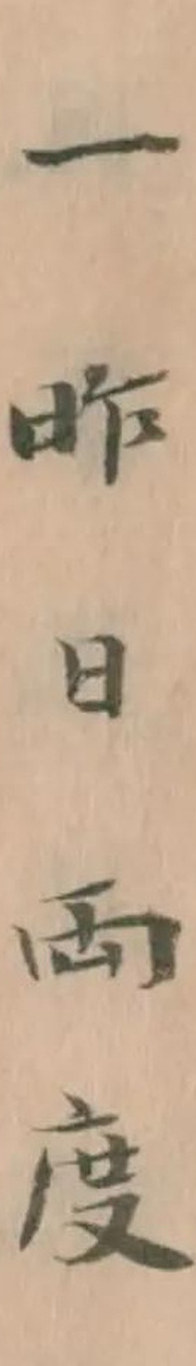一昨日両度
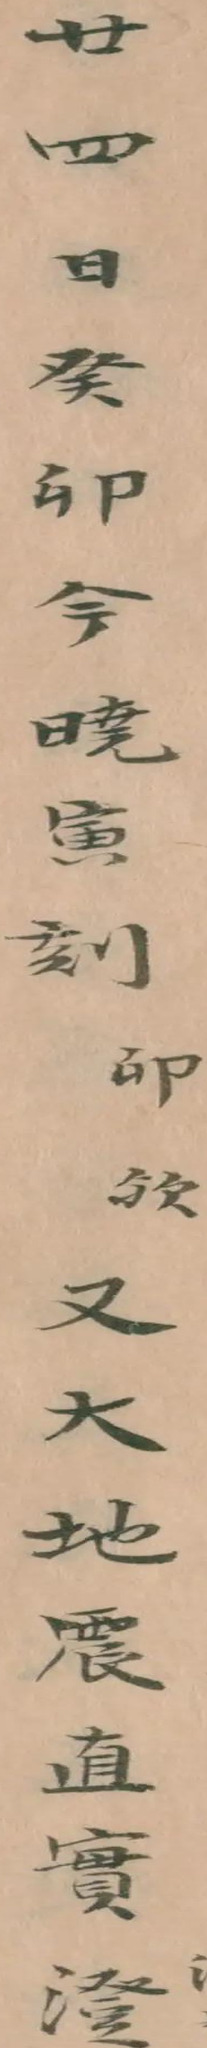廿四日癸卯今暁寅刻卯歟又大地震直実澄
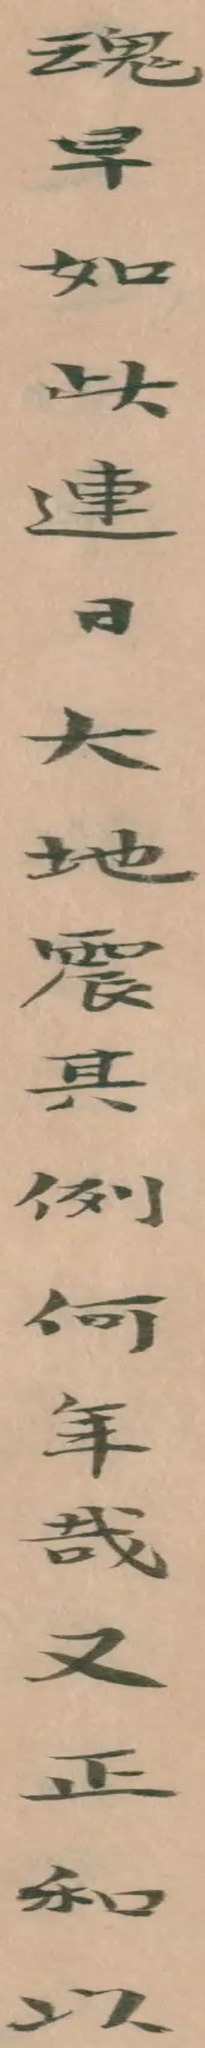魂早如此連日大地震其例何年哉又正和以
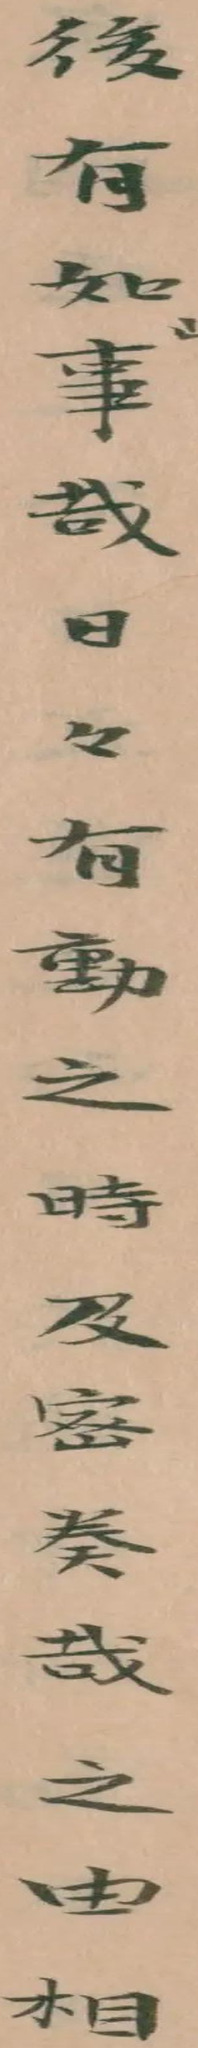後有如此事哉日々有動之時及密奏哉之由相
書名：地災撮要. 巻5-6(地震之部)
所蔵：国立国会図書館 National Diet Library, JAPAN
